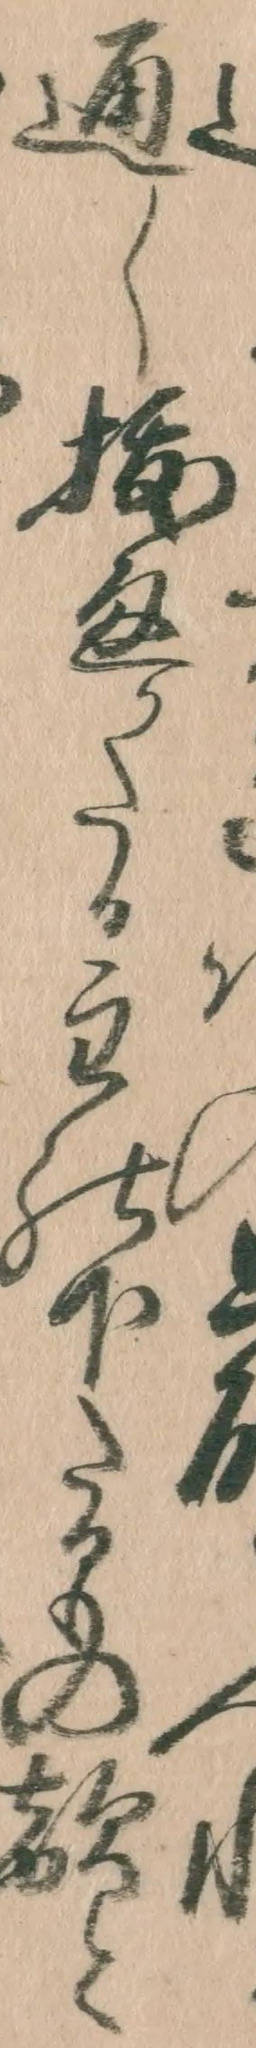通し抜通りたる主の下たるもの敵と
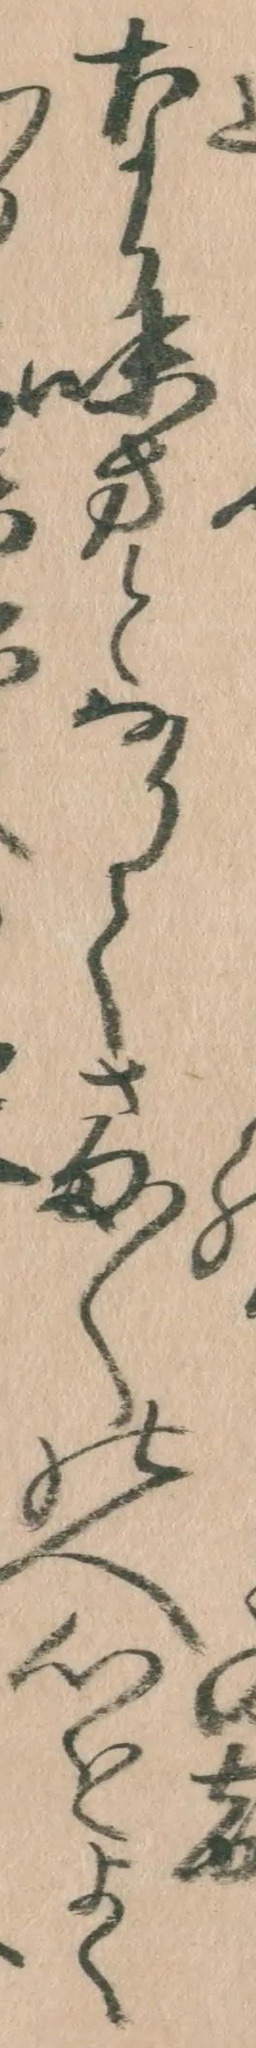なり味方となりてさま〳〵の人心をよく
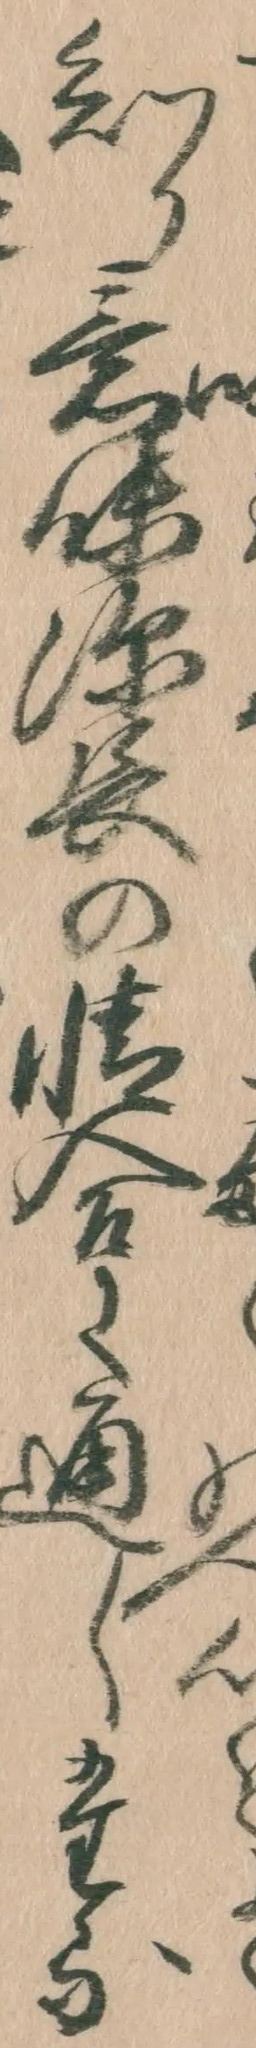知り意味深長の情合に通したる
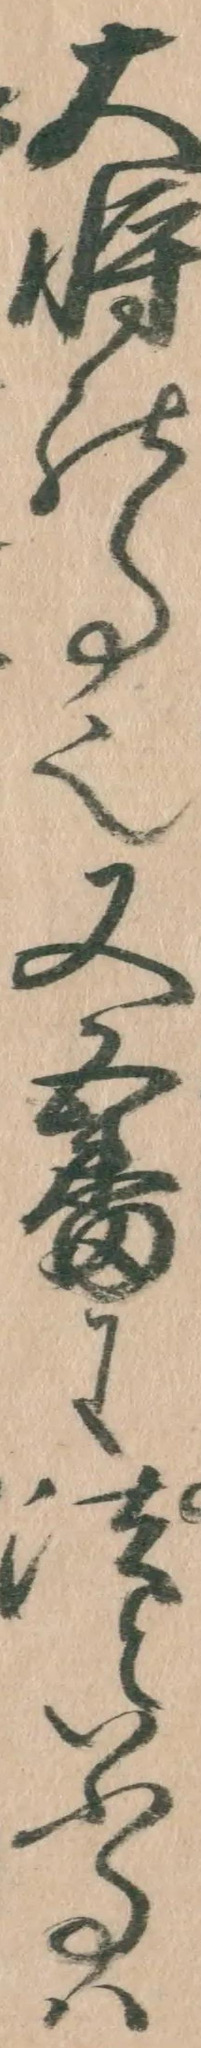大将の事也又五番に法といふ事ハ
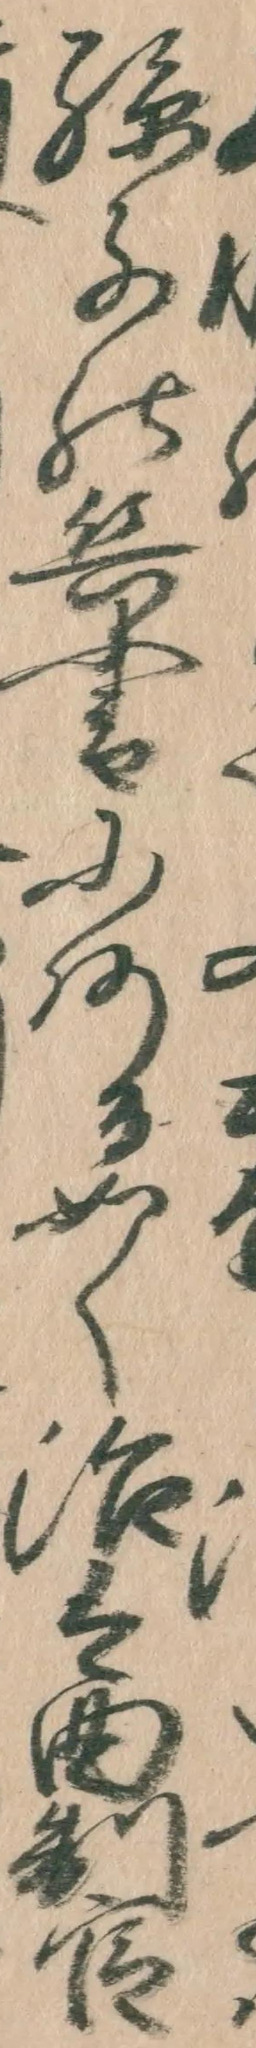孫子の兵書にある如く治は曲制官
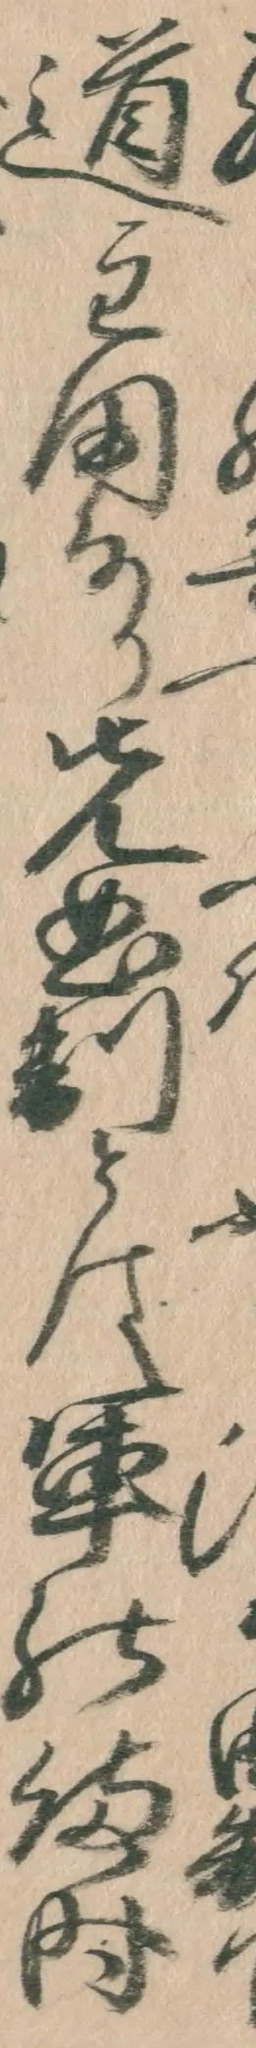道主用なり先怒制とは軍の備時
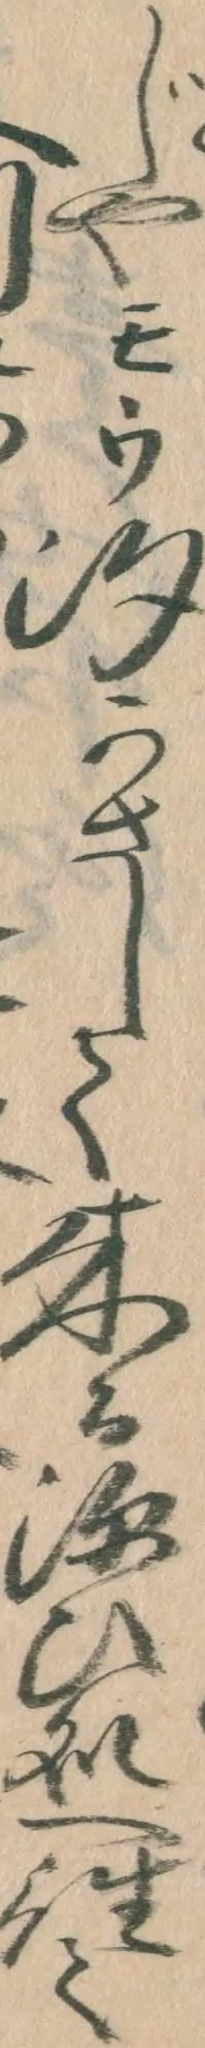じやモウ汐かさして来る深ひ処へ往て
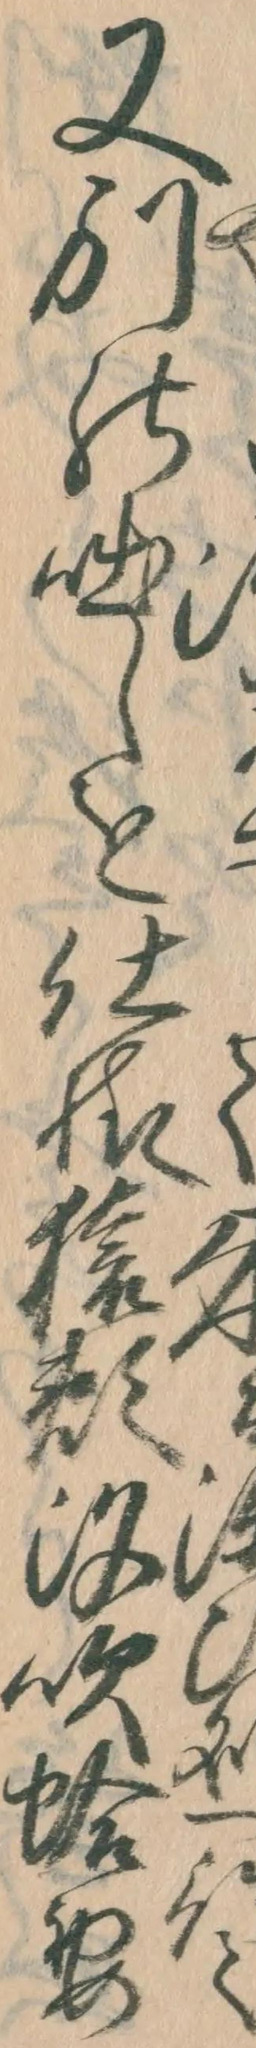又別の咄しを仕様猿頬汐吹蛤初め

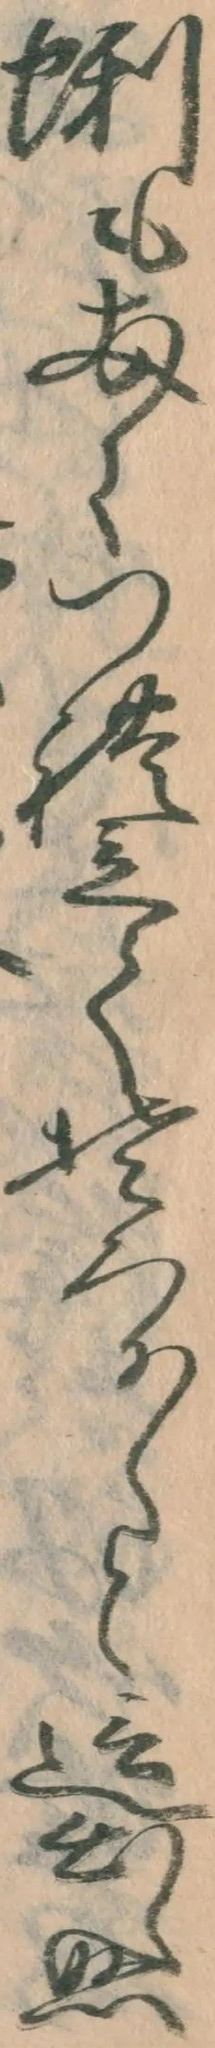蜊も友につれ立てそろ〳〵と這出しぬ
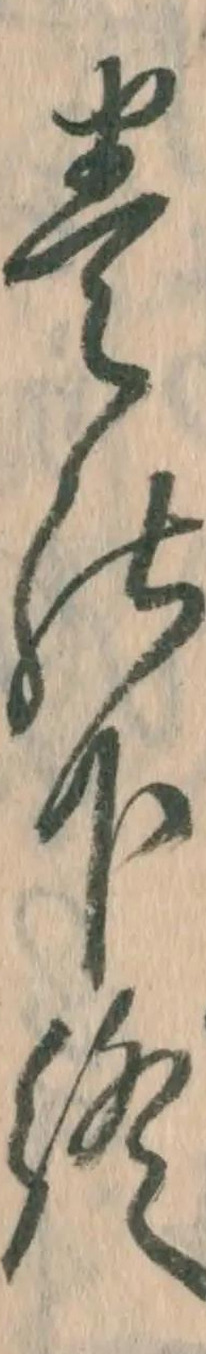巻の下終

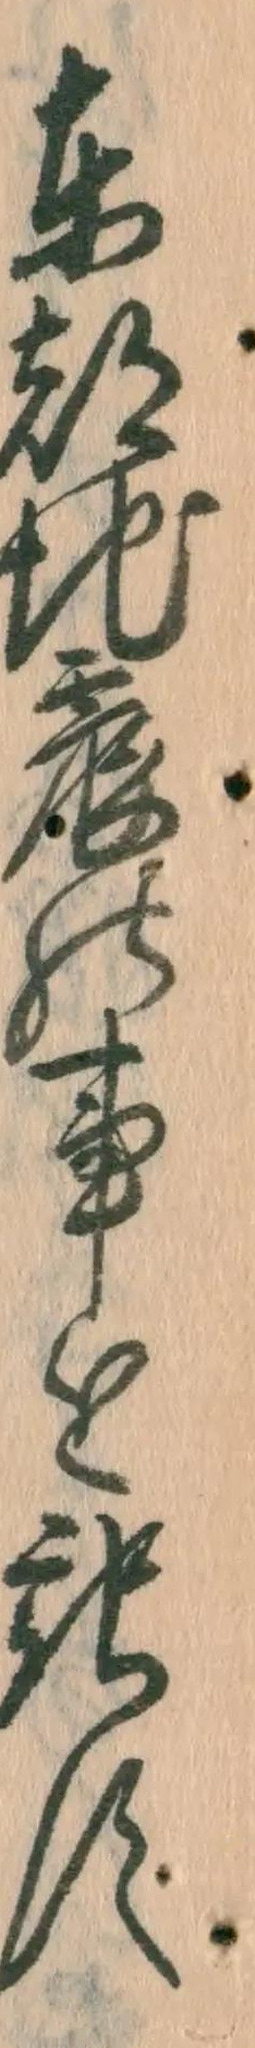東都地震の事を記す
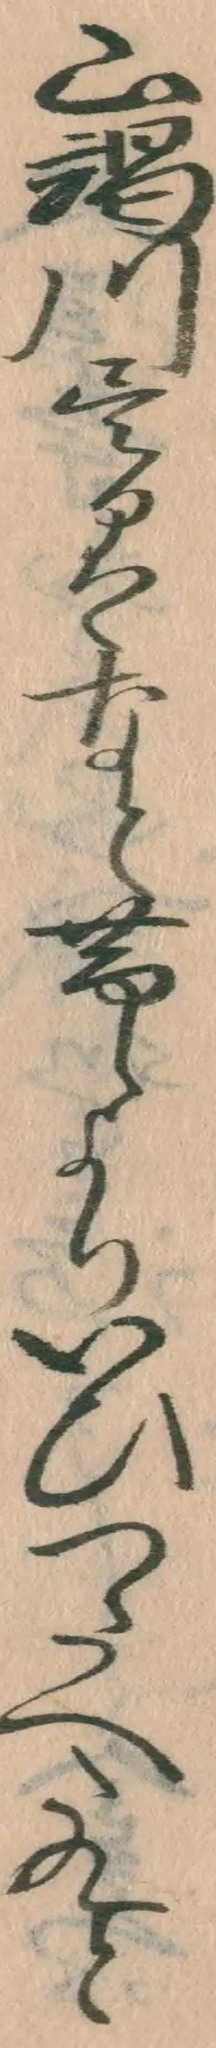山謁川尽るはなと昔しよりいひつたへたれと
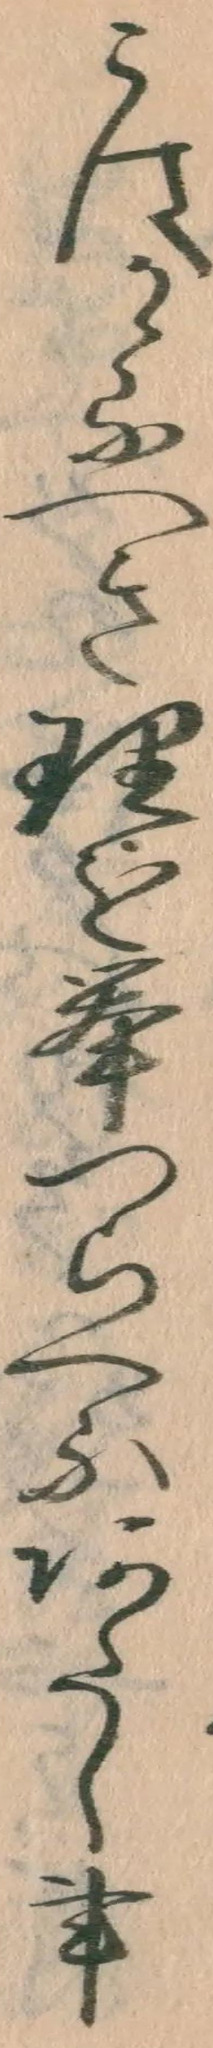ニはかヽるへき理を挙つらへるあたし事
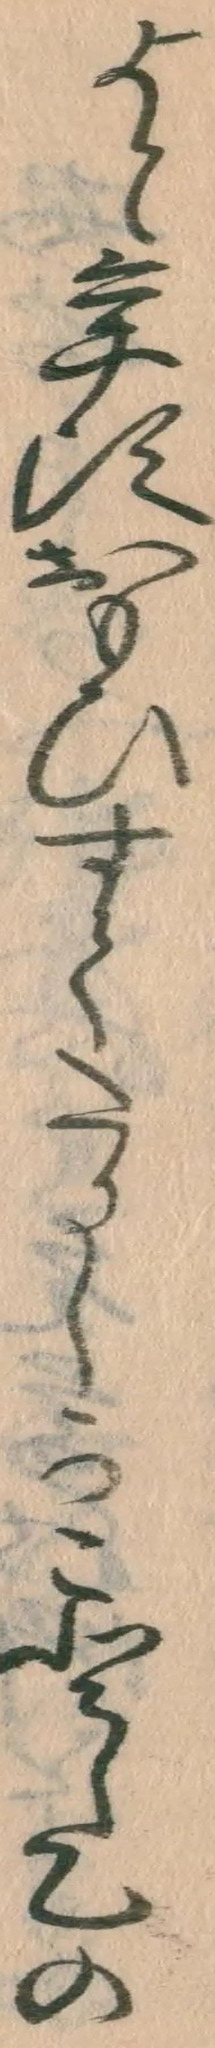よと年頭おもひすてたりしかことし乙の
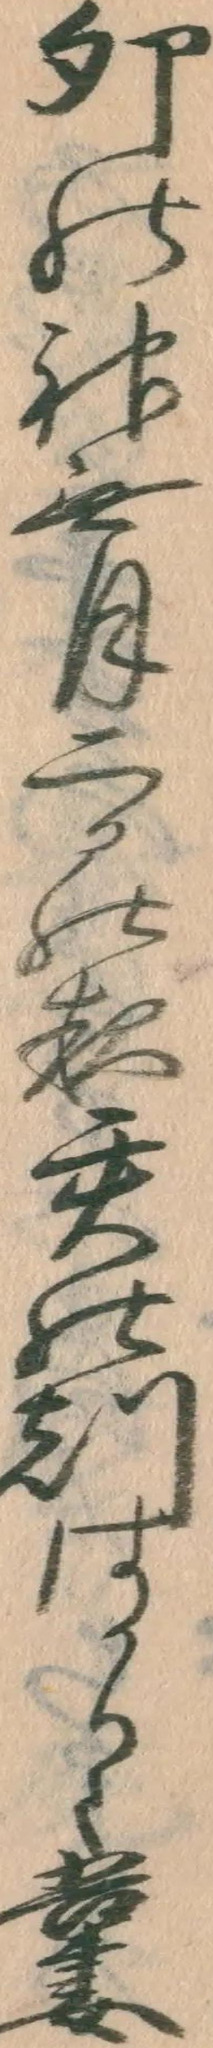卯の神無月二日の夜亥の刻はかりに吾妻
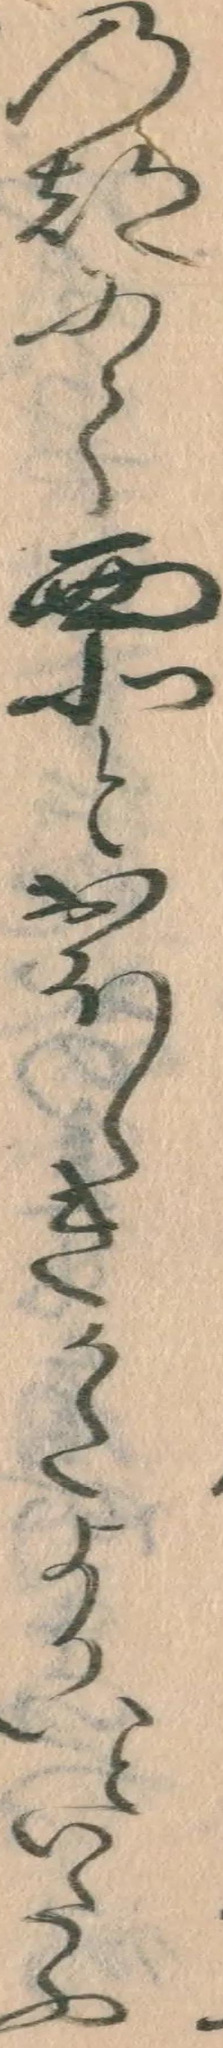の都にて西北とおほしきかたよりいといたふ
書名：麗斎叢書. 20
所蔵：国立国会図書館 National Diet Library, JAPAN
